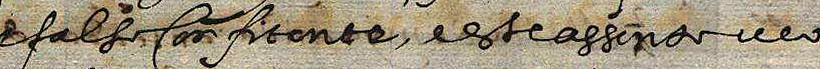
e falso Confitente, e este assento ueo
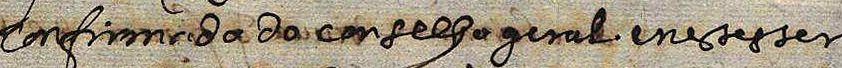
confirmado do conselho geral. e nestes ter
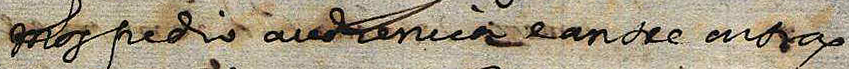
mos pedio audiencia e antre outras
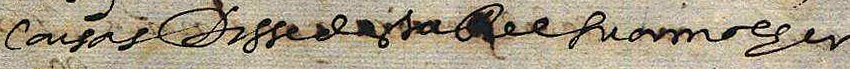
cousas Disse desta Ree sua molher
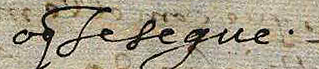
o q̄ se segue.
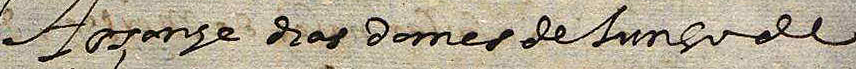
Aos onze dias do mes de Iunho de
